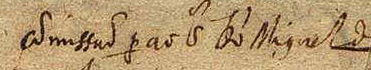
cōmissaõ ꝑa o sor Dō Miguel de
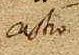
castro
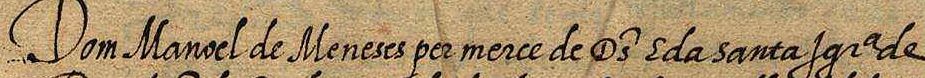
Dom Manoel de Meneses per merce de Ds̄ E da santa Jgra de
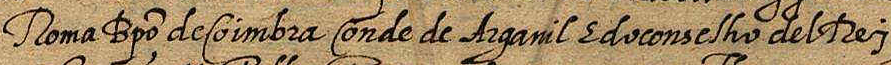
Roma Bpō de Coimbra Conde de Arganil E do conselho del Rey
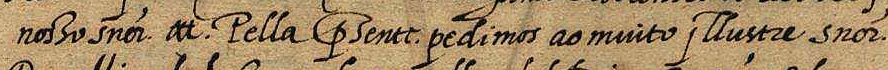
nosso snor̄. ett. Pella p̄sente pedimos ao muito jllustre snor̄
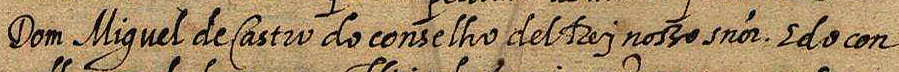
Dom Miguel de Castro do conselho del Rey nosso snōr. E do con
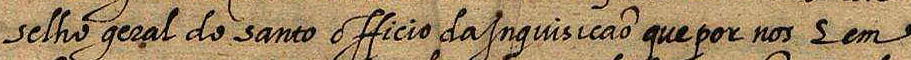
selho geral do santo officio da Jnquisiçaõ que por nos E em
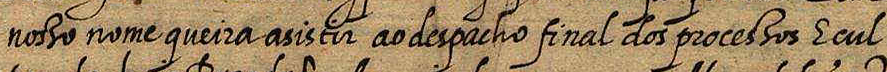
nosso nome queira asistir ao despacho final dos processos E cul
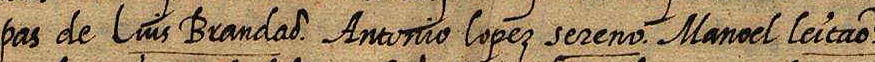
pas de Luis Brandaõ. Antonio lopez sereno. Manoel leitaõ
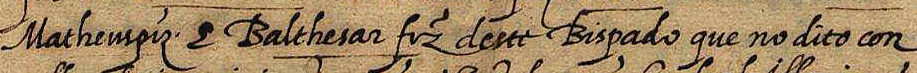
Matheus pīz. E Balthesar frz̄ deste Bispado que no dito con
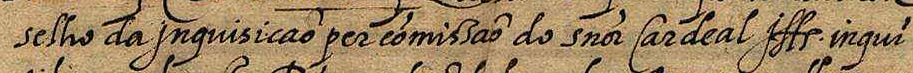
selho da jnquisicaõ per cōmissaõ do snor̄ Cardeal Jffꝭ. inqui
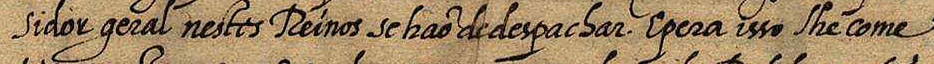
sidor geral nestes Reinos se haõ de despachar. E pera isso lhe come
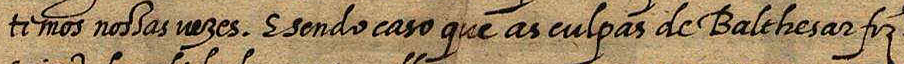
temos nossas uezes. E sendo caso que as culpas de Balthesar frz̄
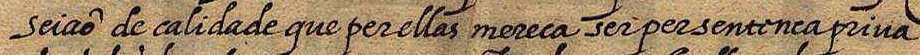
seiaõ de calidade que per ellas mereca ser per sentença priua
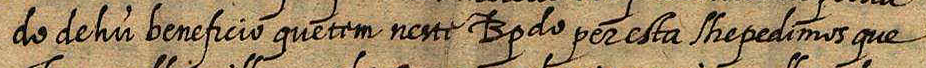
do de hū beneficio que tem neste Bpdo per esta lhe pedimos que
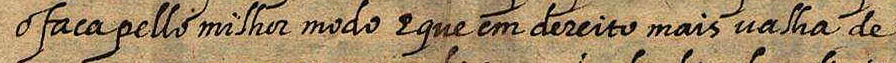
o faça pello milhor modo E que em dereito mais ualha de
